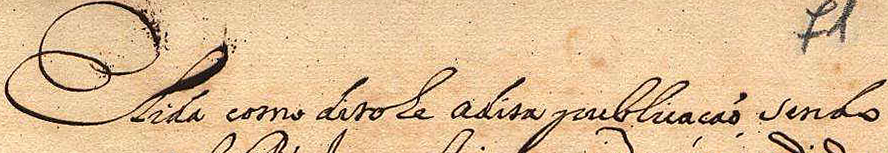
E lida como dito he a dita publicaçaõ sendo
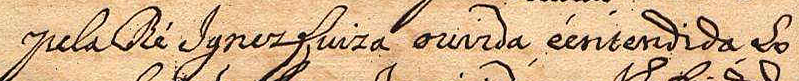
pela Ré Ignez Luiza ouvida, e entendida Lo
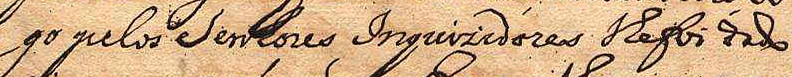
go pelos Senhores Inquizidores lhe foi dado
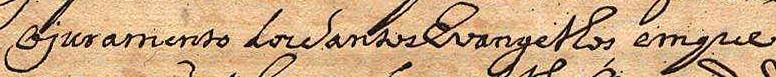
o juramento dos Santos Evangelhos em que
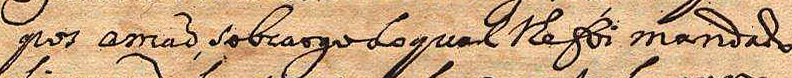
pos a maõ, sob cargo do qual lhe foi mandado
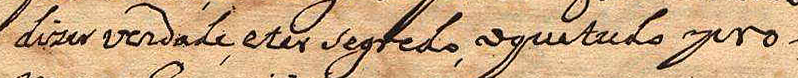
dizer verdade, e ter segredo, o que tudo pro
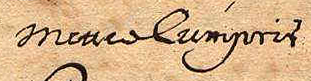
metteo Cumprir
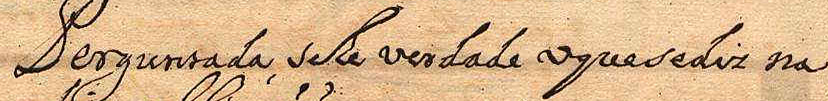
Perguntada, se he verdade o que se diz na
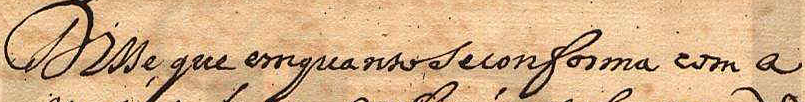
Disse, que emquanto se conforma com a
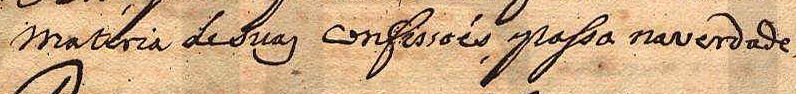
materia de suas confissoẽs, passa na verdade.
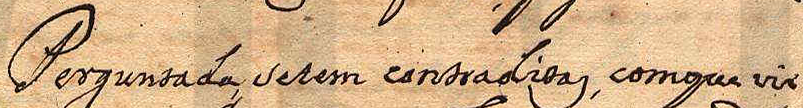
Perguntada, se tem contraditas, com que vir
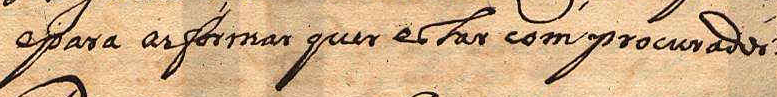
e para as formar quer estar com procurador
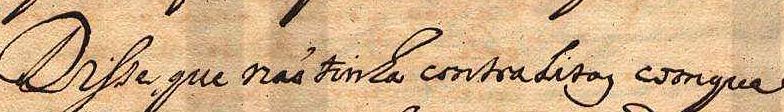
Disse que naõ tinha contraditas com que
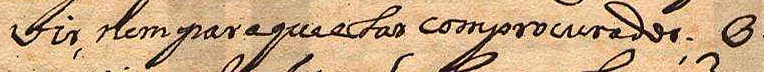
vir, nem para que estar com procurador. O
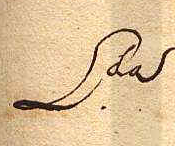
L.da
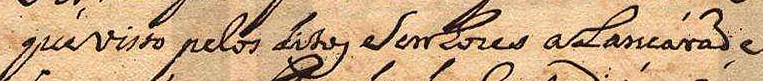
que visto pelos ditos Senhores a Lançaraõ, e
